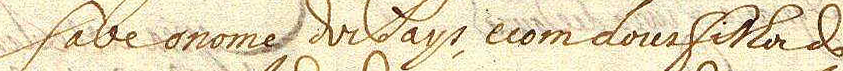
Sabe o nome dos Pays, e com dous filhos do
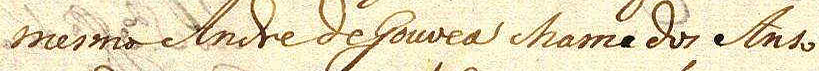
mesmo Andre de Gouvea chamados Anto
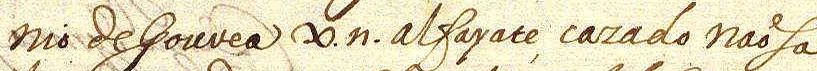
nio de Gouvea x. n. alfayate, cazado naõ sa
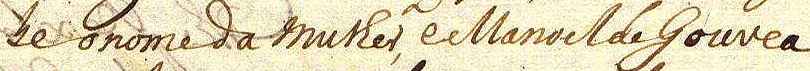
be o nome da mulher, e Manoel de Gouvea
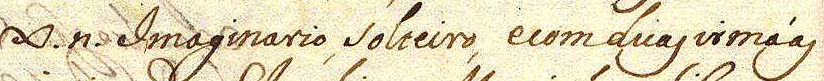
x. n. Imaginario, solteiro, e com duas irmaãs
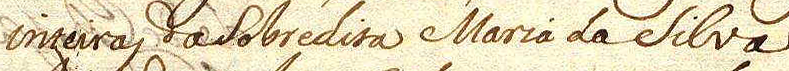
inteiras da sobredita Maria da Silva
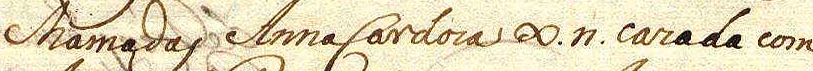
chamadas Anna Cardoza x. n. cazada com
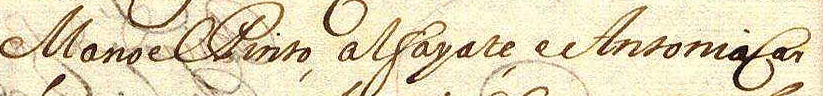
Manoel Pinto, alfayate, e Antonia Car
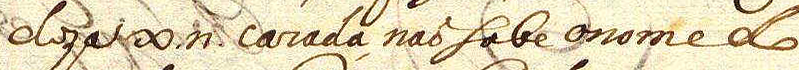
dozo x. n. cazada, naõ sabe o nome do
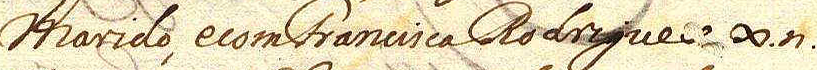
marido, e com Francisca Rodrigue_ x. n.
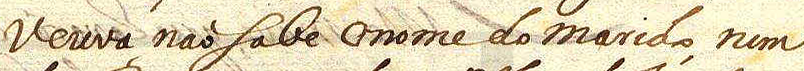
Veuva naõ sabe o nome do marido, nem
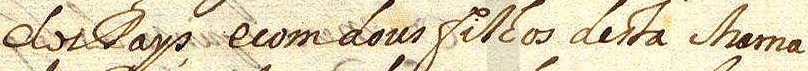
dos Pays, e com dous filhos desta chama
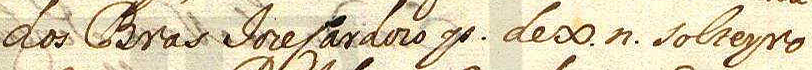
dos Bras Ioze Cardozo p. de x. n. solteyro
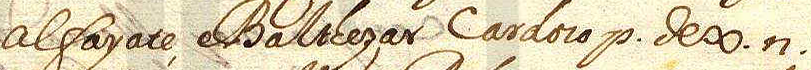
alfayate, e Balthezar Cardozo p. de x. n.
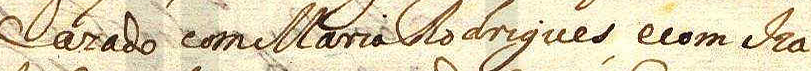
cazado com Maria Rodrigues, e com Iza
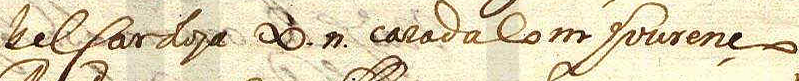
bel Cardoza x. n. cazada com Lourenço
